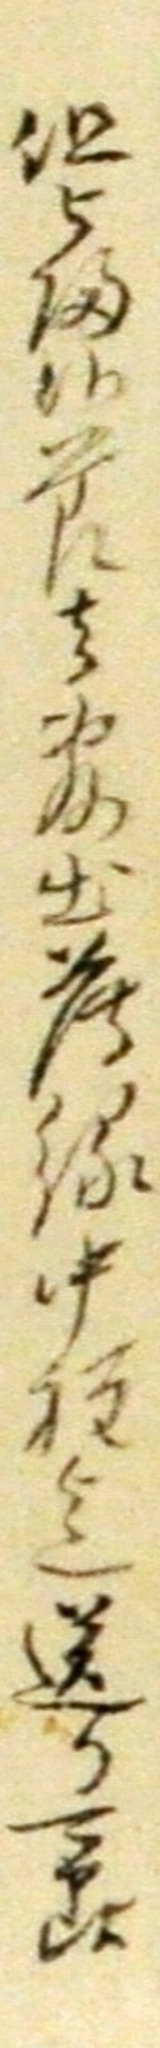但被帰候節者敷出薄縁中程迄送り可申候
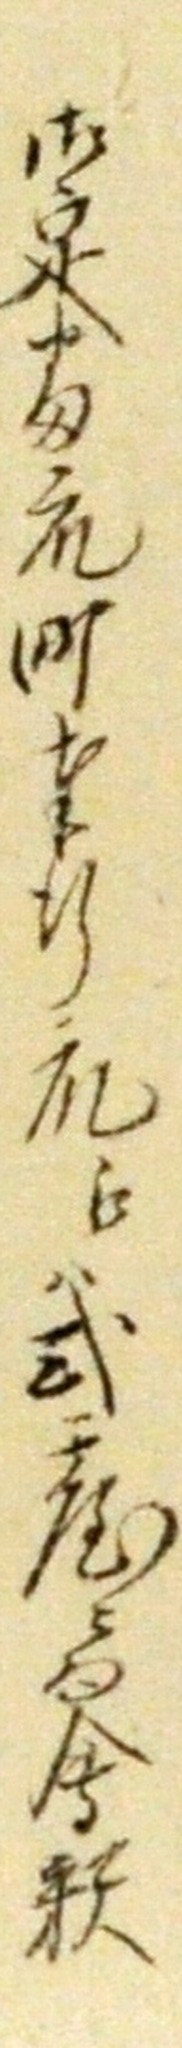御定番衆町奉行衆江ㇵ式台ニ而会釈
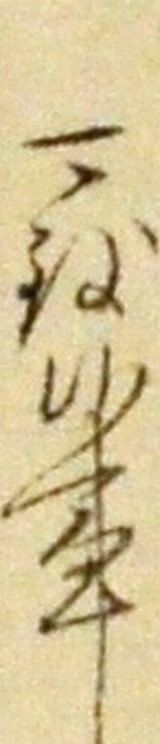可致候事
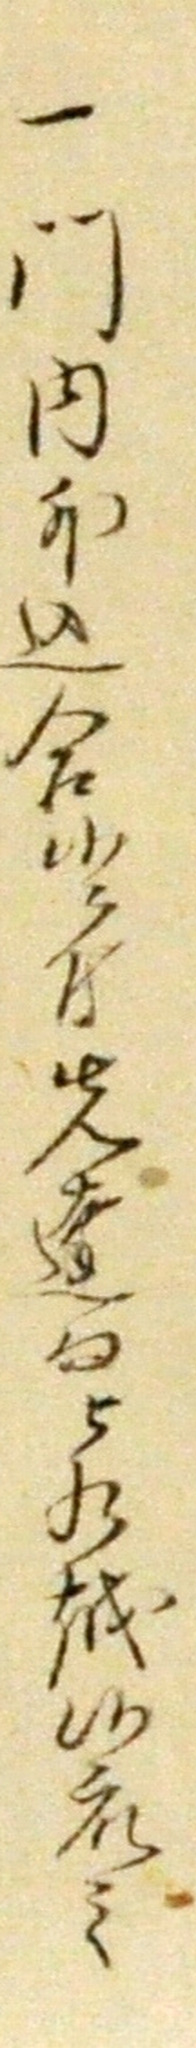一門内外込合候二付先達而被相越候衆之
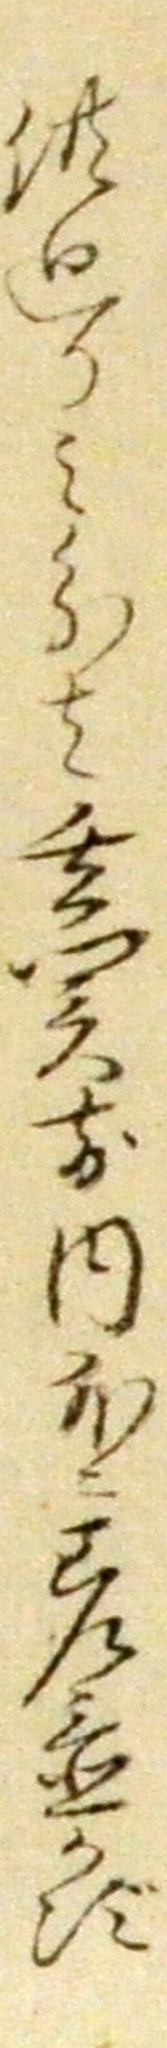供廻り之分者玄関前内外ニ差置かず
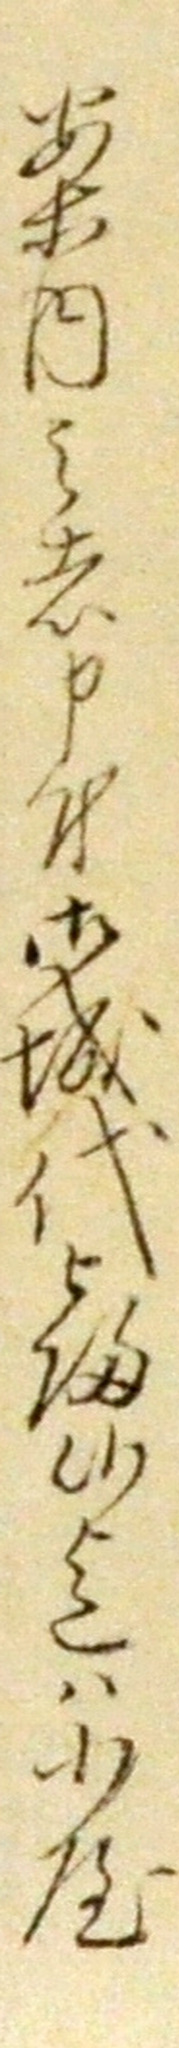案内之者申付御城代被帰候迄ㇵ小屋
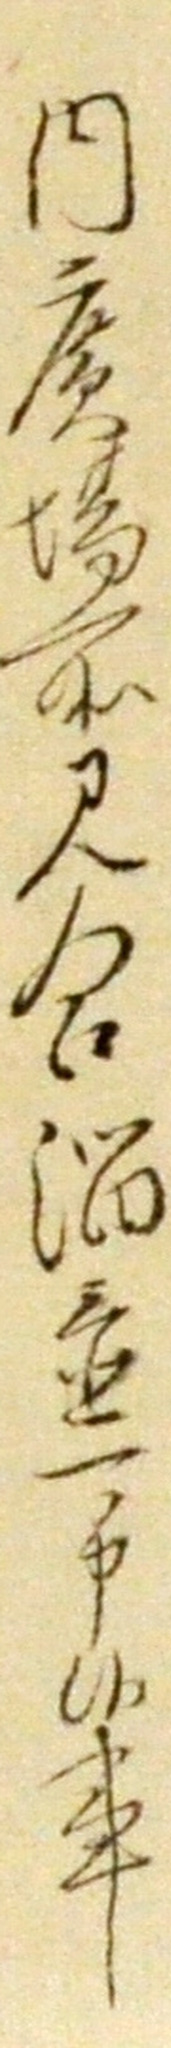内広場所見合溜置可申候事
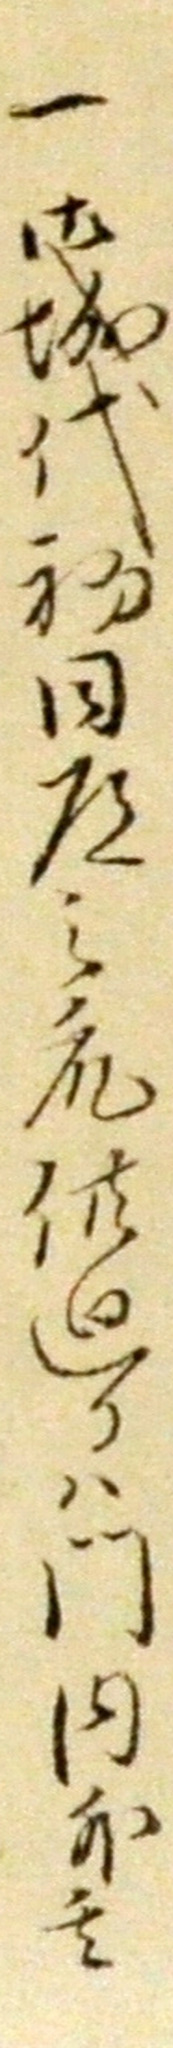一御城代初同道之衆供廻りㇵ門内外其
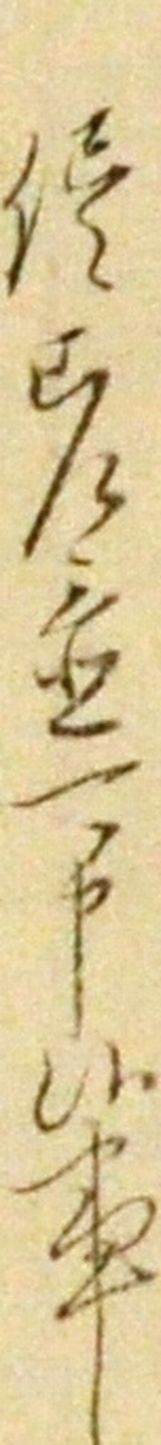侭差置可申候事
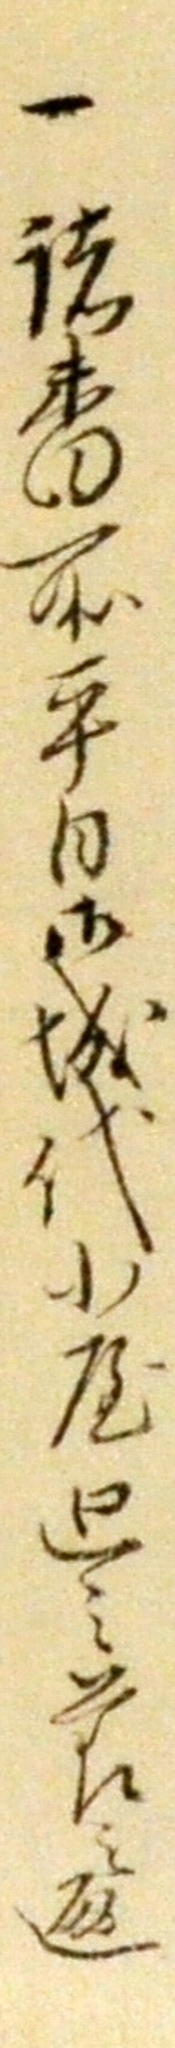一諸番所平日御城代小屋廻之節之通
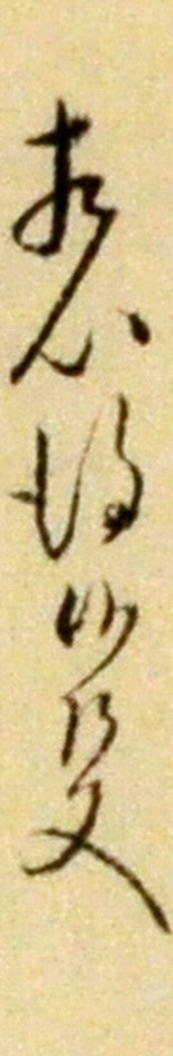相心得候事
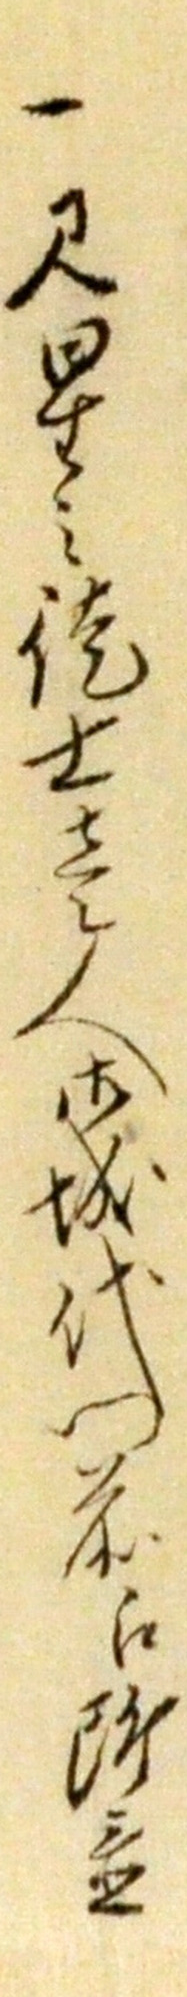一見星之徒士壱人御城代門前江附置
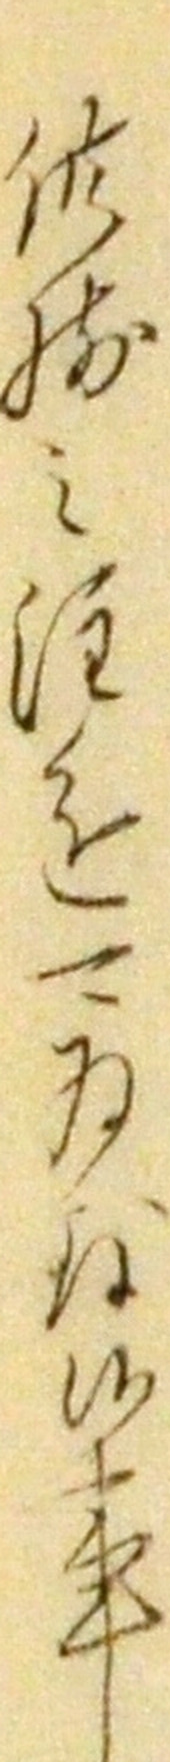供揃之注進可為致候事
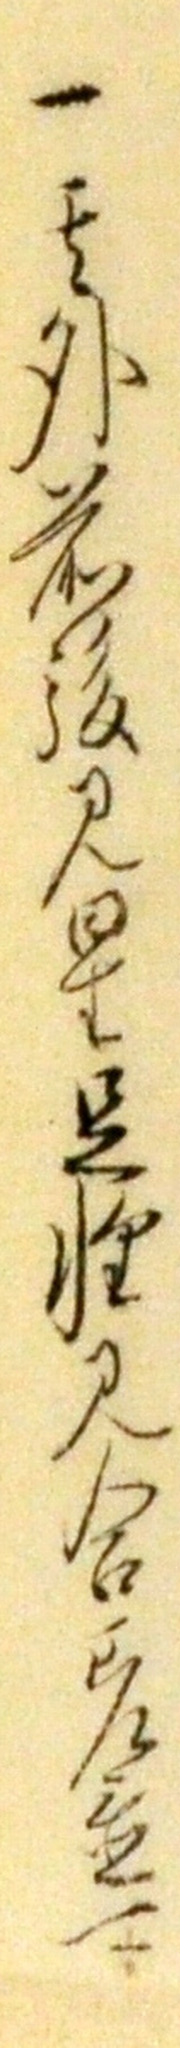一其外前後見星足軽見合差置可
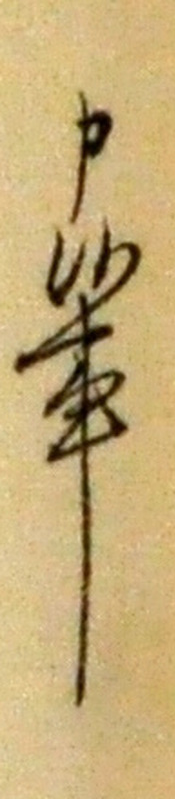申候事
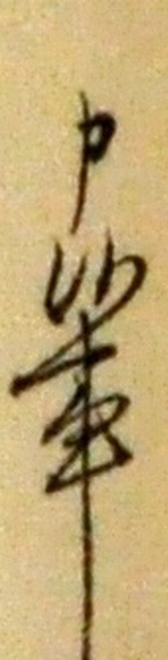申候事
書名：大阪加番関係諸書留〔一括〕
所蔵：伊那市立高遠町図書館・合同会社AMANE
